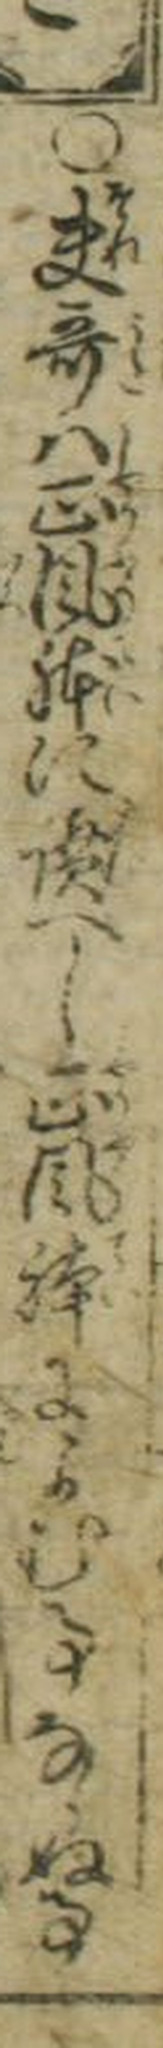○夫哥は正風体に讀べし。正風体によむ事ならぬ事
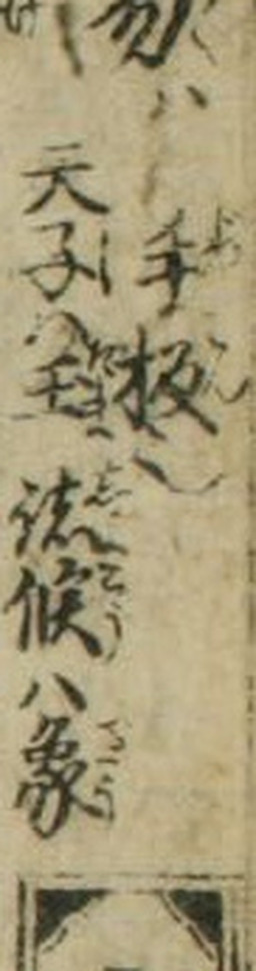天子は玉諸侯は象
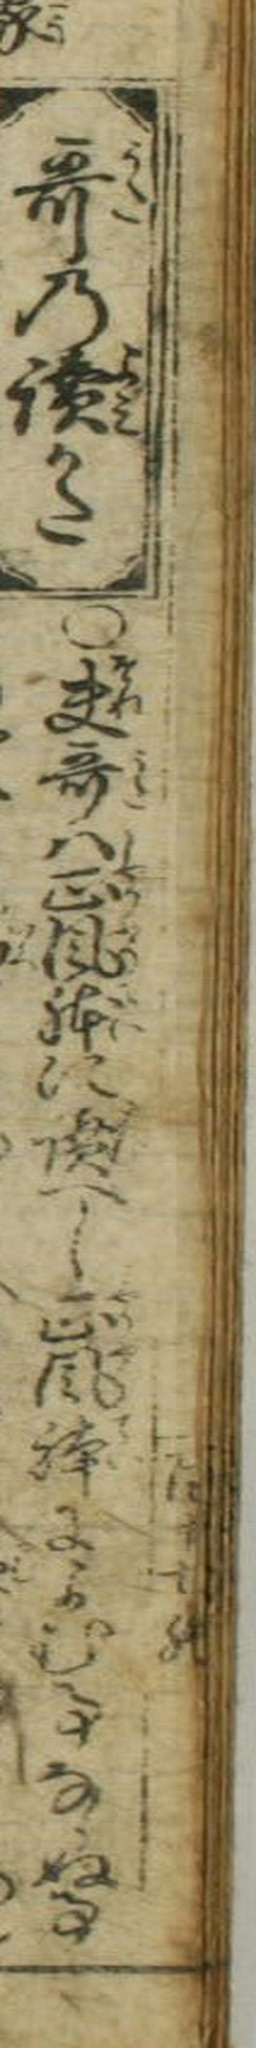○夫哥は正風体に讀べし。正風体によむ事ならぬ事
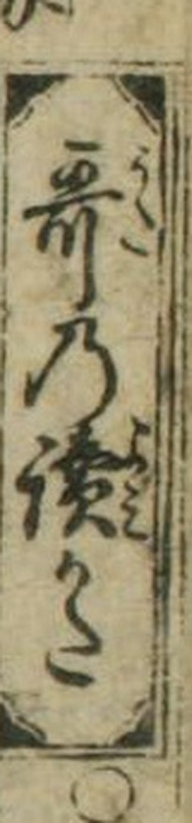哥の讀かた
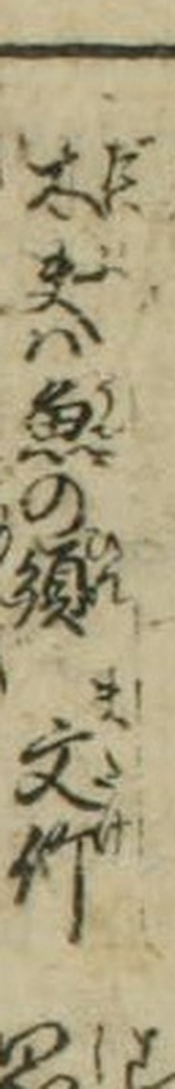太夫は魚の須文竹
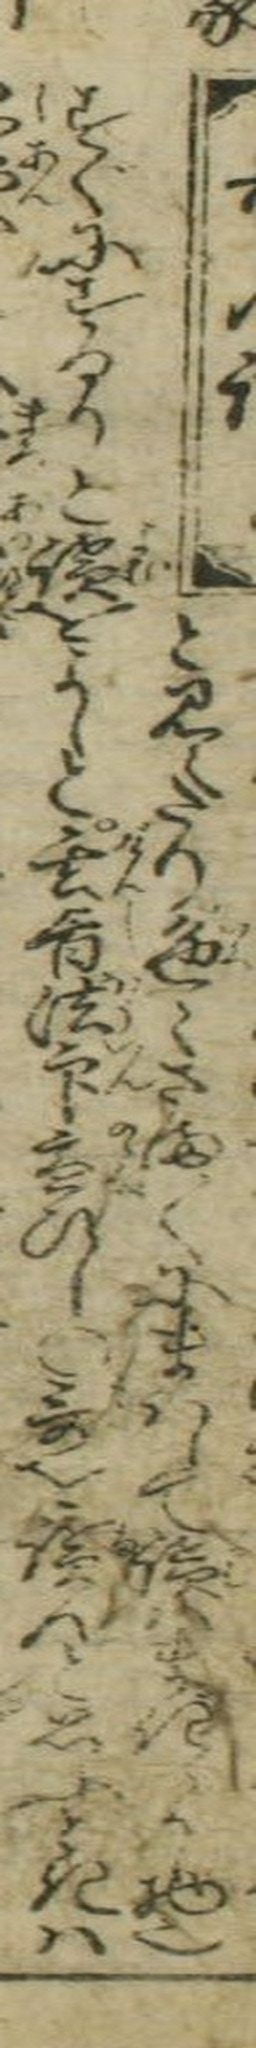すぐにするりと讀をよしと。玄旨法印宣ひし○哥を讀んと思ふときは
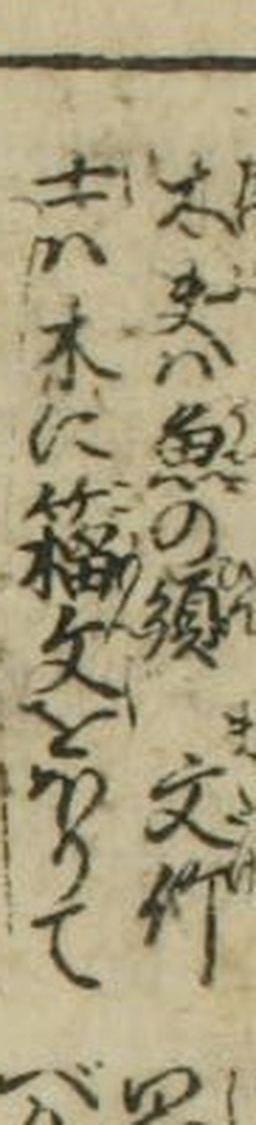士は木に籀文をほりて
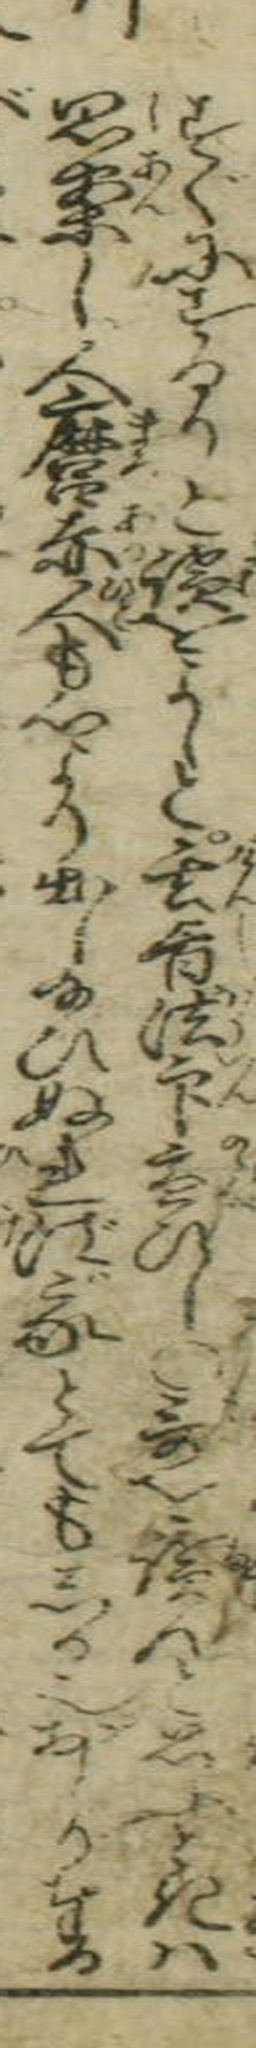思案し。人麿赤人も心より出し給ひぬれば。我とてもしか也。おとり奉る
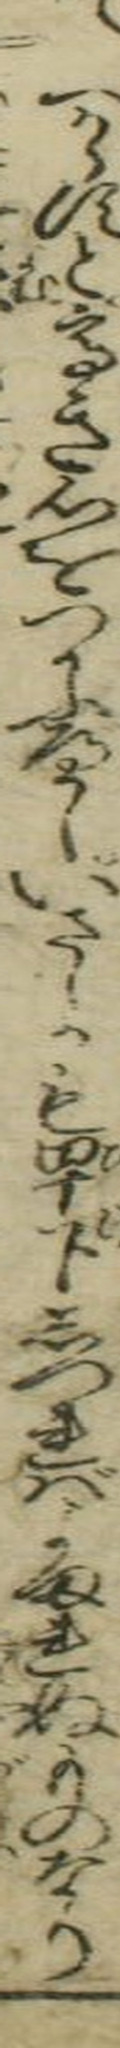べからすと。高き心をつかふべし。いさゝかも卑下しつればよまれぬものなり
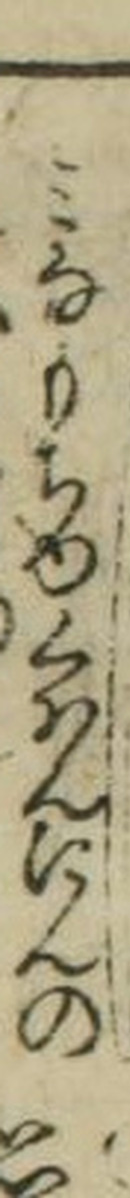みなもちゆくはんにんの
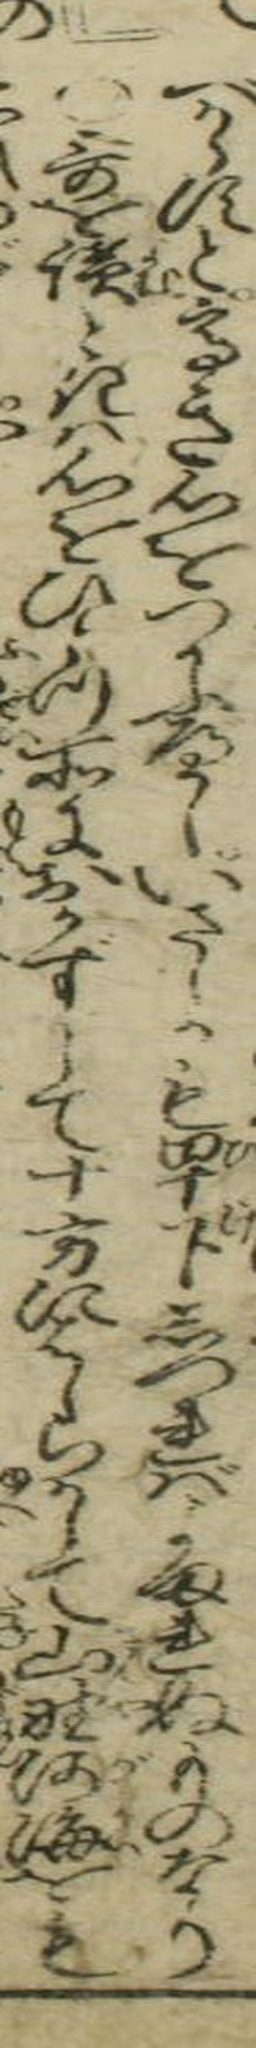○哥を讀ときは心をひとつ所におかずして。十方にはしらかして山野河海をも
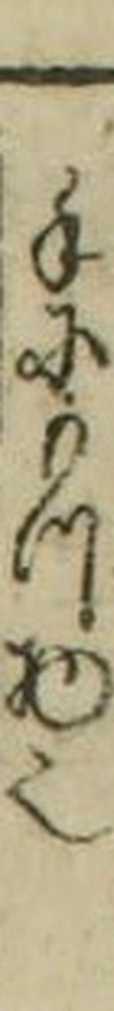手にもつ物也
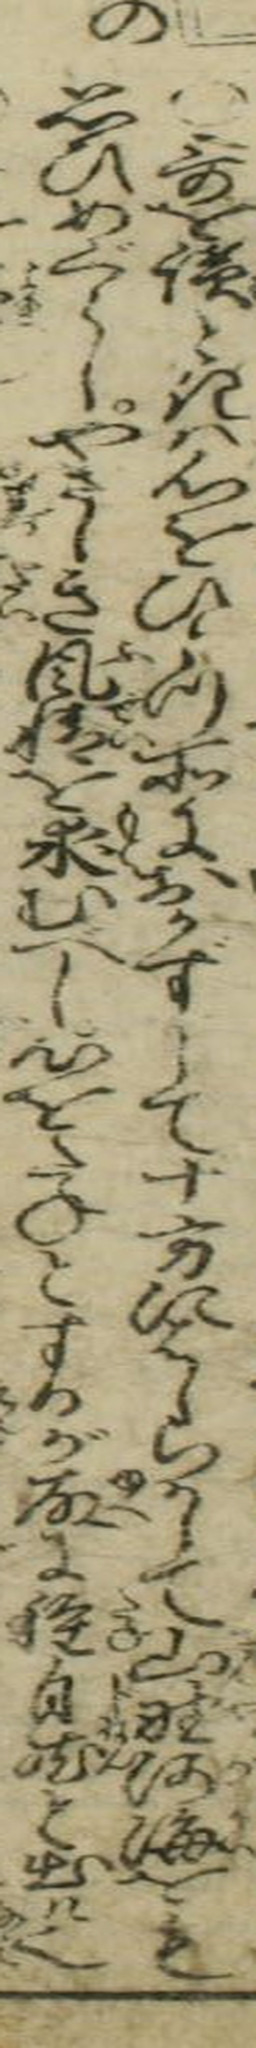思ひめぐらし。やさしき風情を求むべし。心をたねとするが故に種自然と出る也
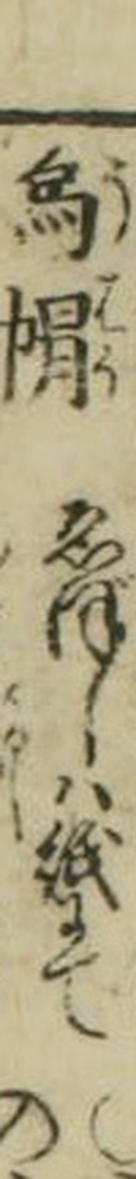烏帽ゑぼしは紙にて
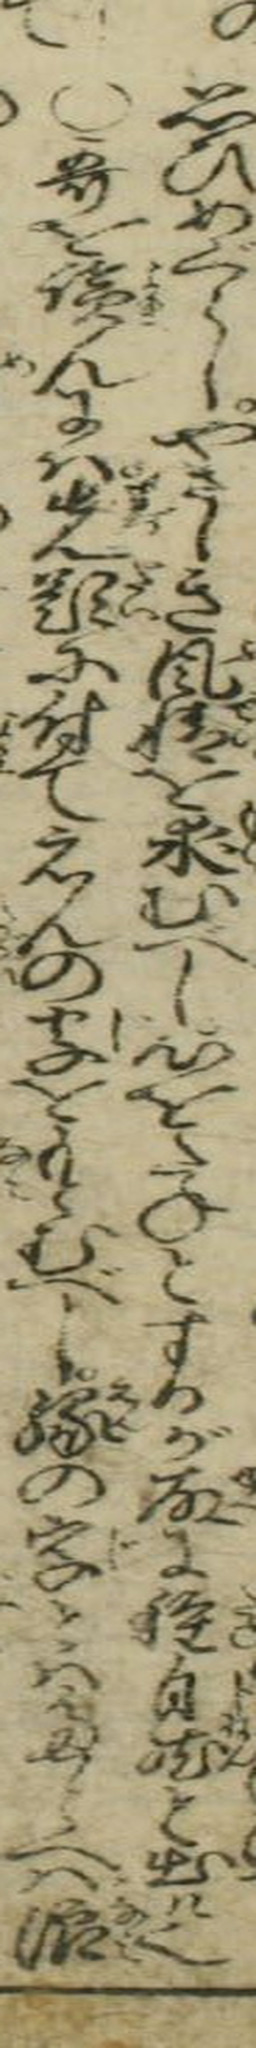○哥を讀んには。先題に付てえんの字をもとむべし。縁の字とはたとへば浪
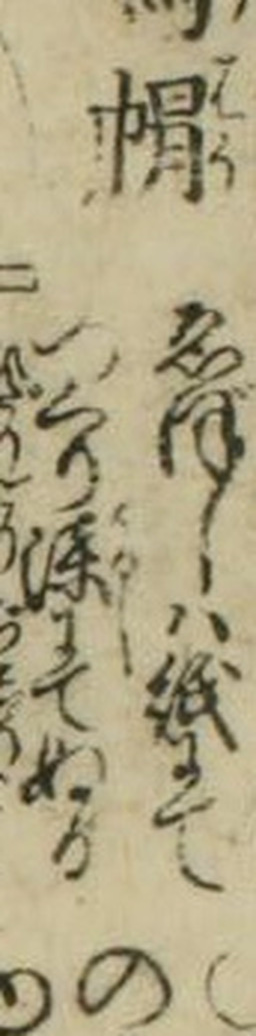つくり漆にてぬる
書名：女源氏教訓鑑
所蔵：東京学芸大学附属図書館
